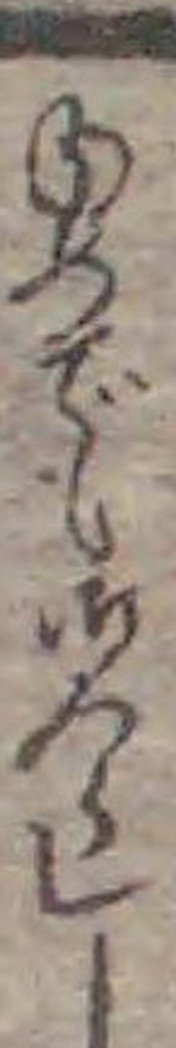ゆめでも御入らし
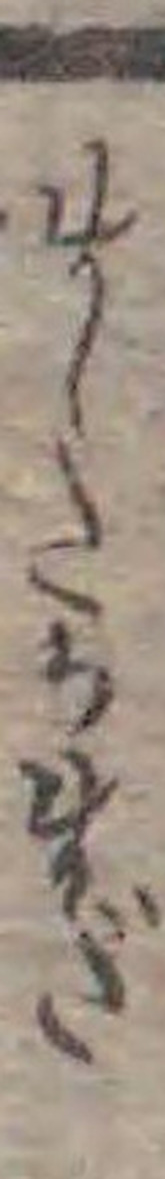ましたかまだ
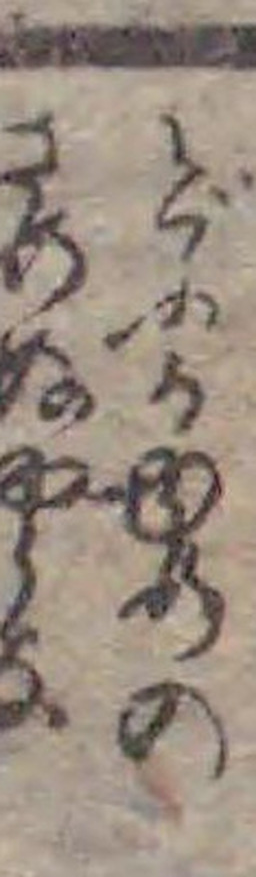さめぬやうな
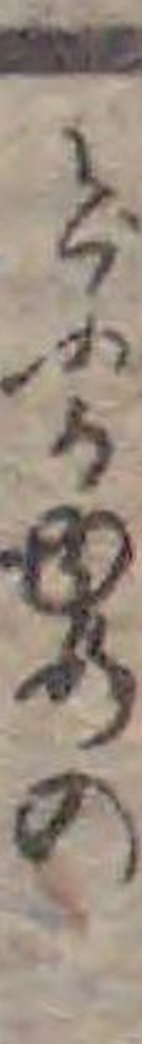どふかゆめの
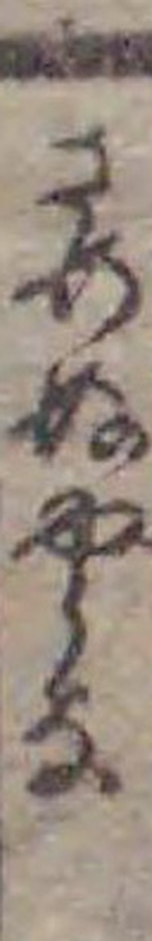さめぬやうな

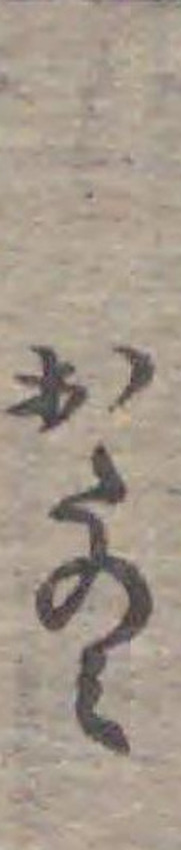おたのみ
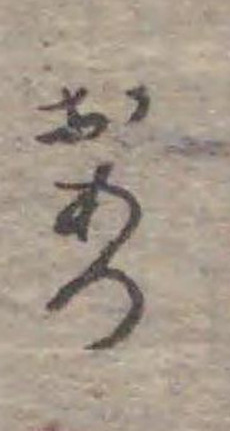おあつ
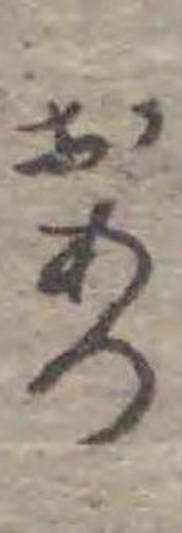おあつ
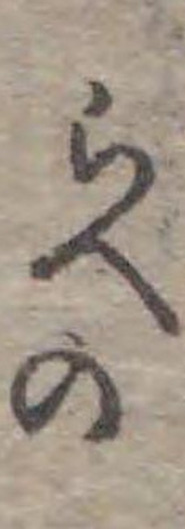らへの
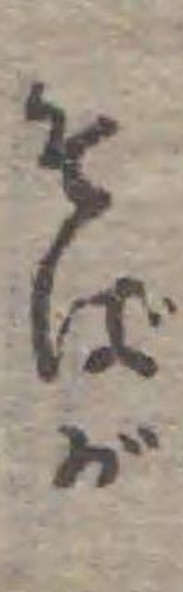そばが
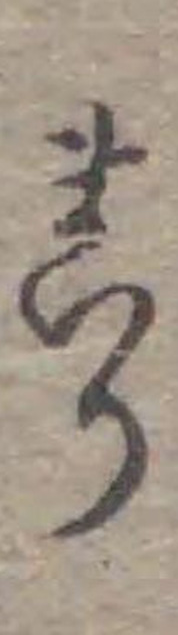まいり
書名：見徳一炊夢 : 3巻
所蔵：国立国会図書館 National Diet Library, JAPAN
